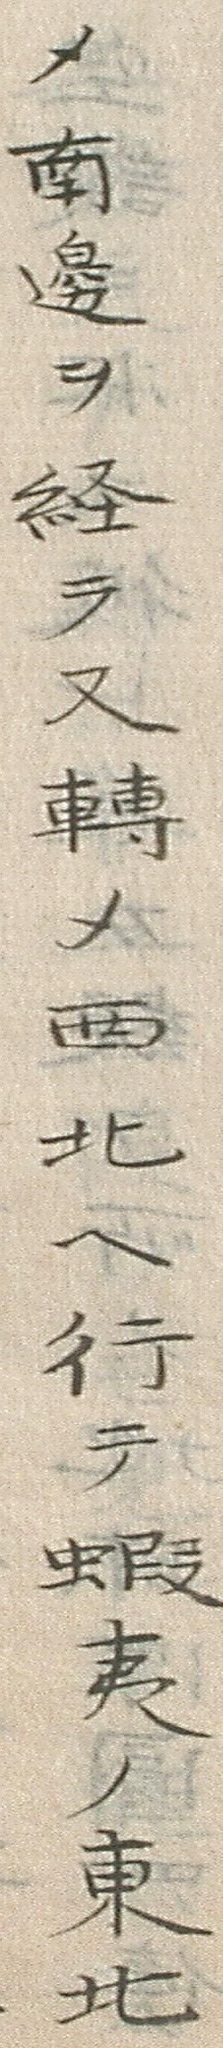シテ南辺ヲ経テ又転シテ西北ヘ行テ蝦夷ノ東北
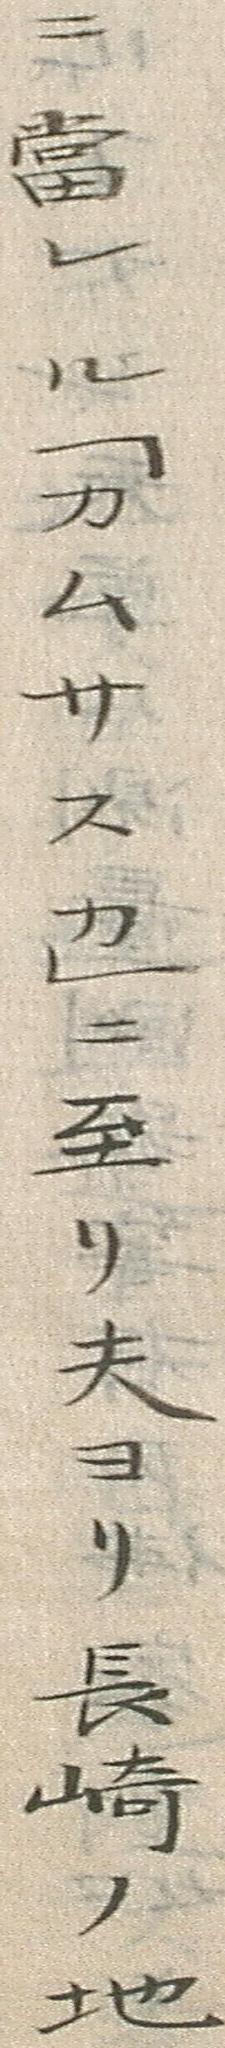ニ当レル「カムサスカ」ニ至リ夫ヨリ長崎ノ地
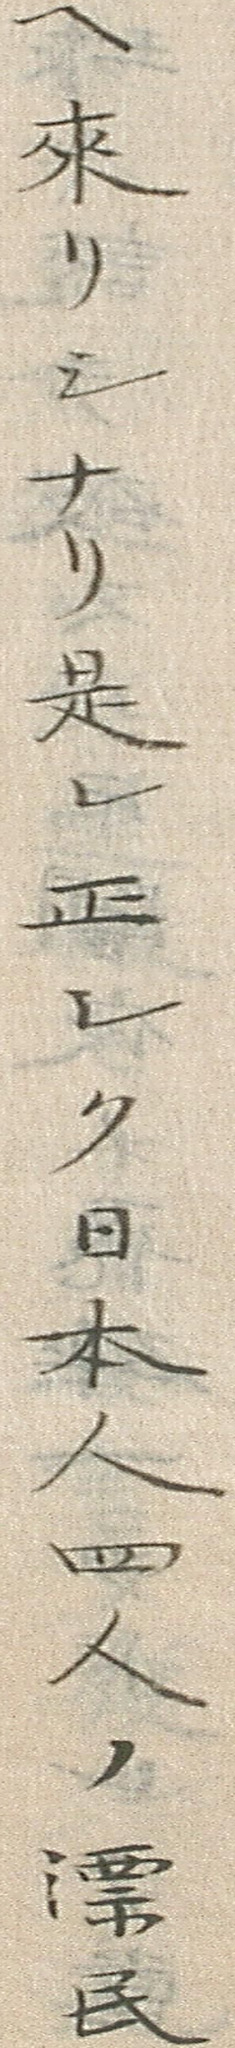ヘ来リシナリ是レ正シク日本人四人ノ漂民
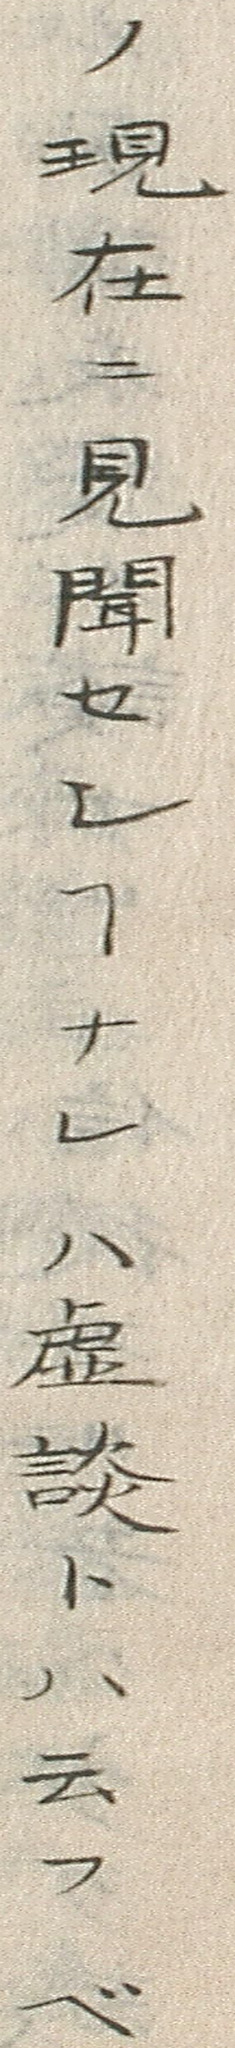ノ現在ニ見聞セシコトナレハ虚談トハ云フベ
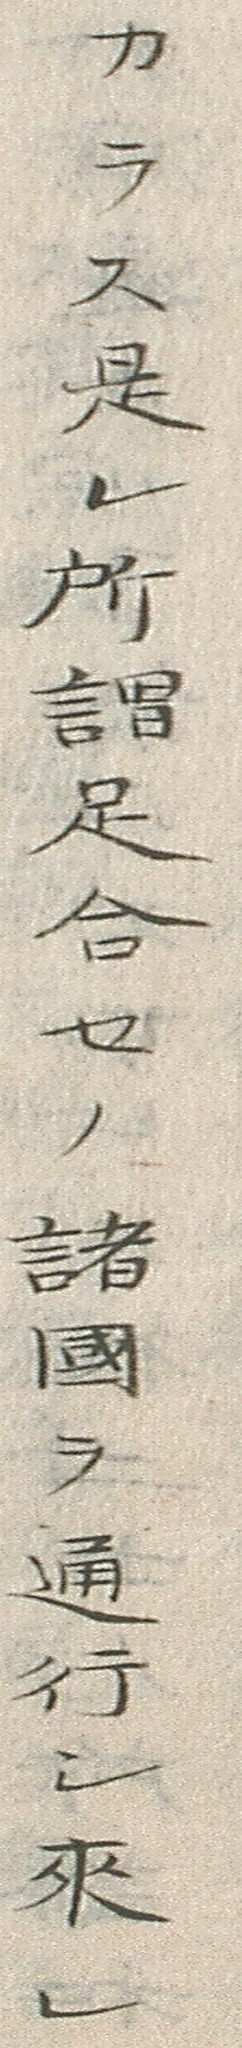カラス是レ所謂足合セノ諸国ヲ通行シ来レ
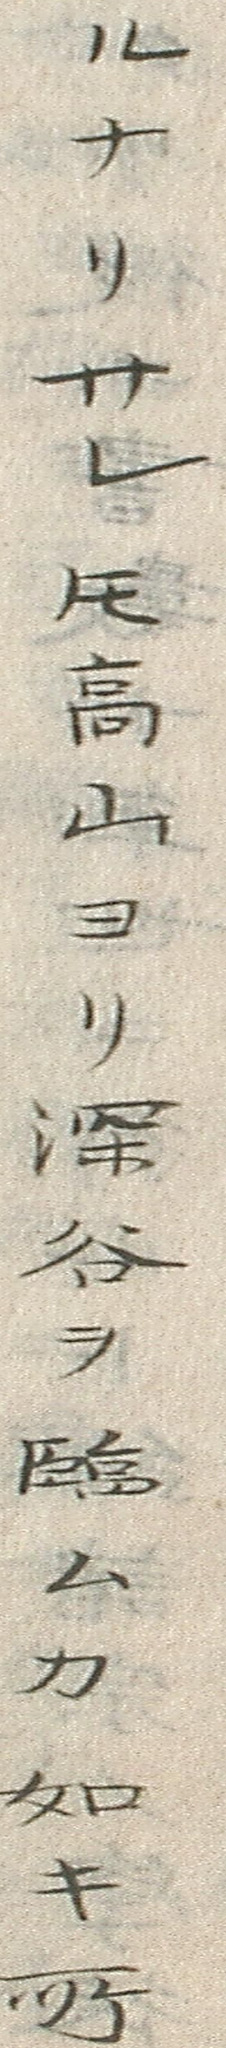ルナリサレトモ高山ヨリ深谷ヲ臨ムカ如キ所
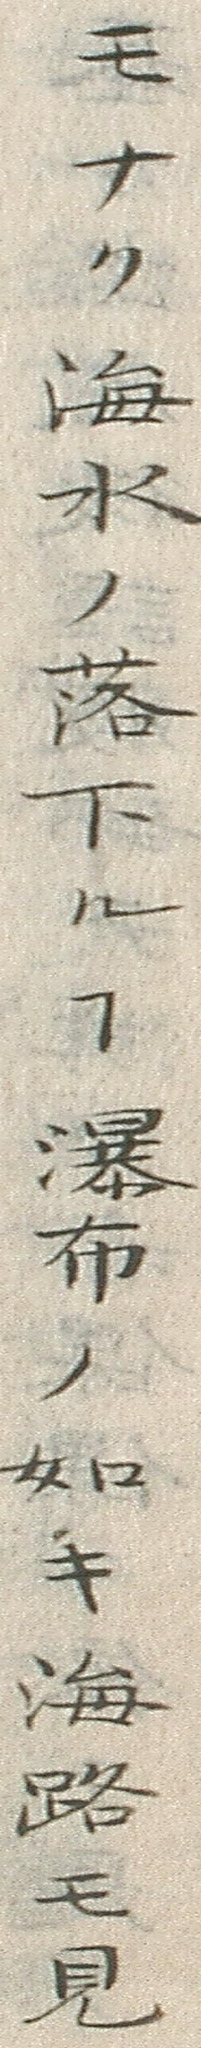モナク海水ノ落下ルコト瀑布ノ如キ海路モ見
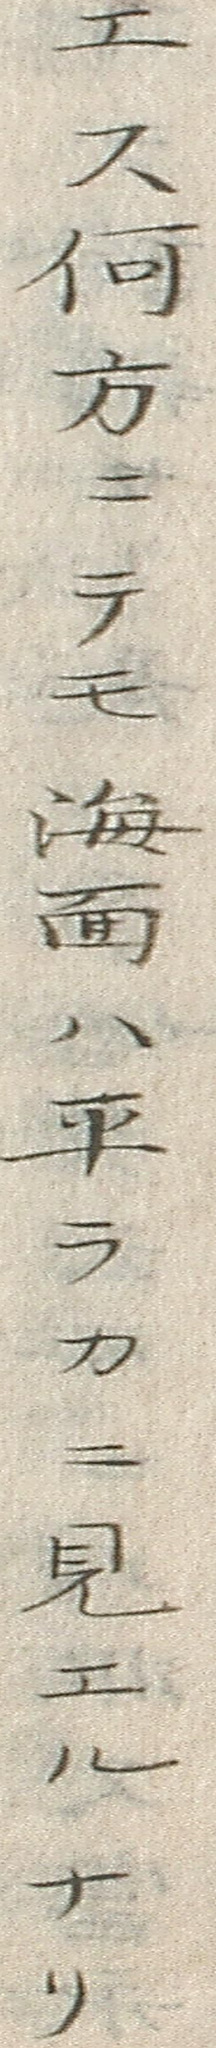エス何方ニテモ海面ハ平ラカニ見エルナリ
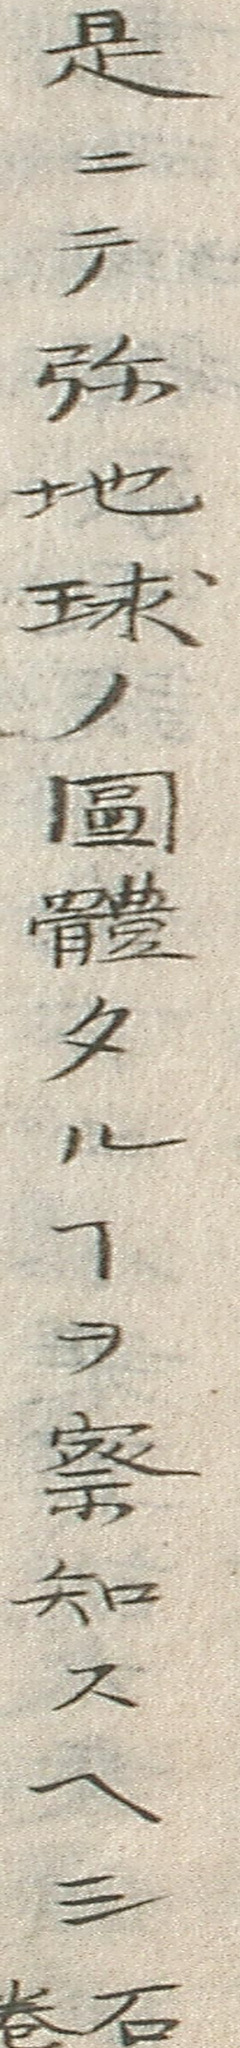是ニテ弥地球ノ図体タルコトヲ察知スヘシ石巻
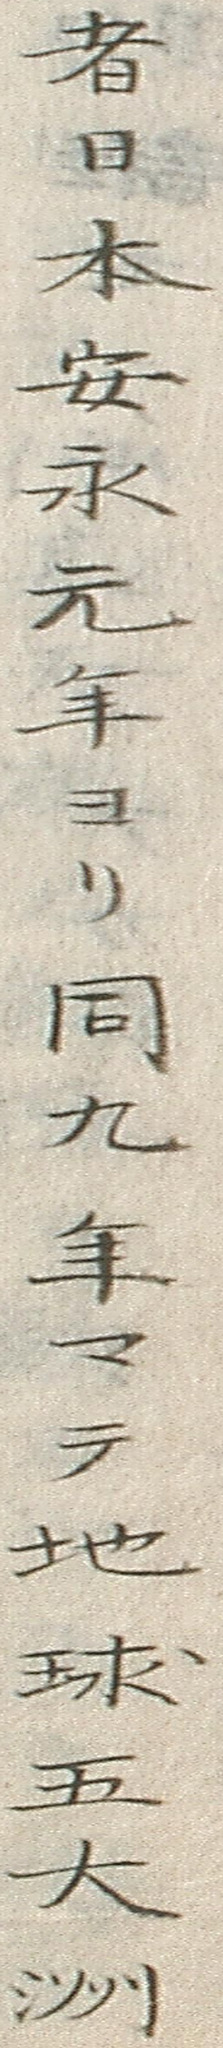者日本安永元年ヨリ同九年マテ地球五大洲
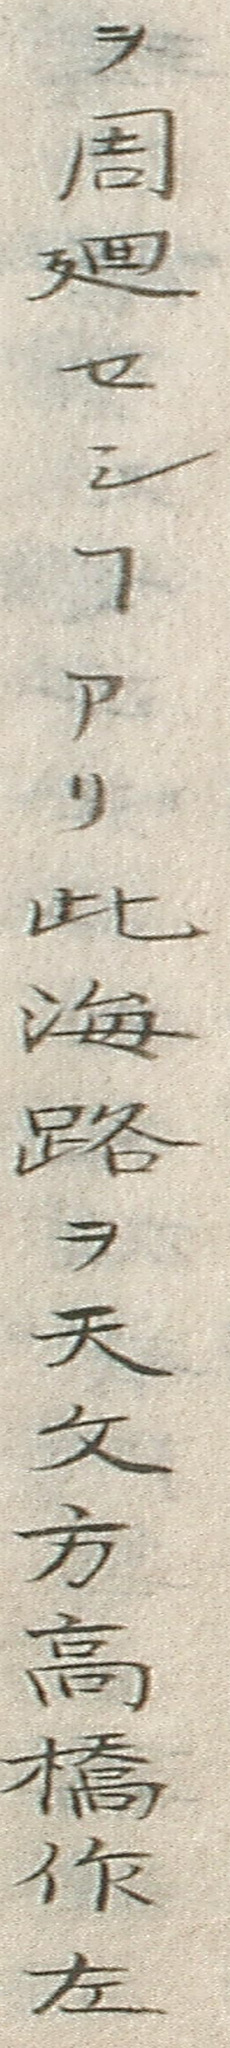ヲ周迴セシコトアリ此海路ヲ天文方高橋作五左

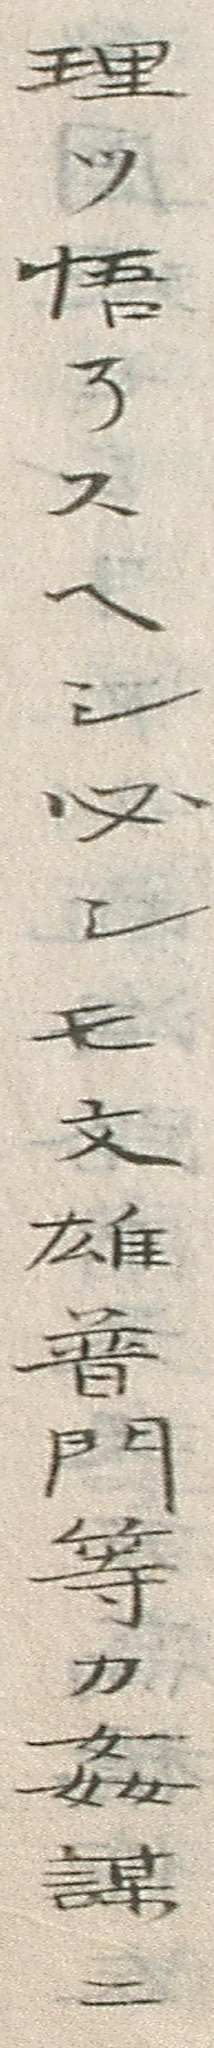理ッ悟了スヘシ必シモ文雄普門等カ姦謀ニ
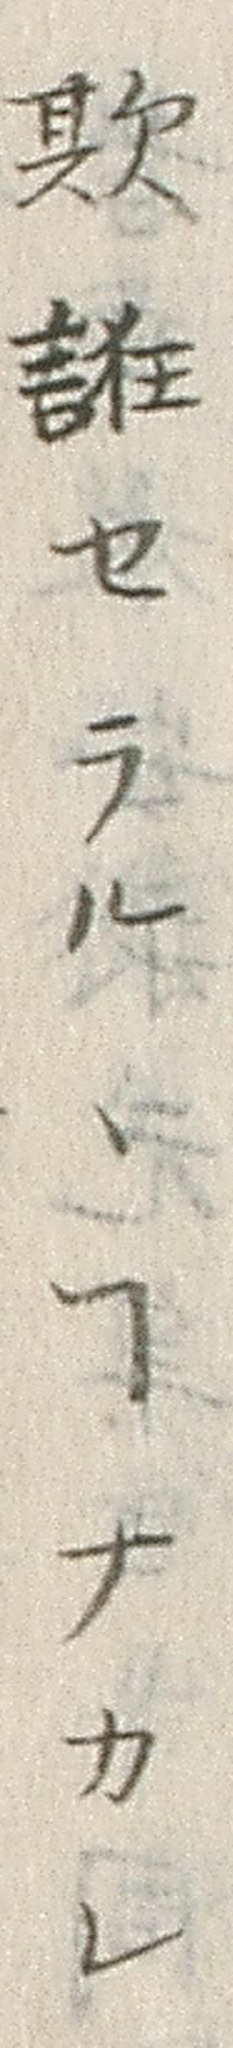欺誑セラルヽコトナカレ
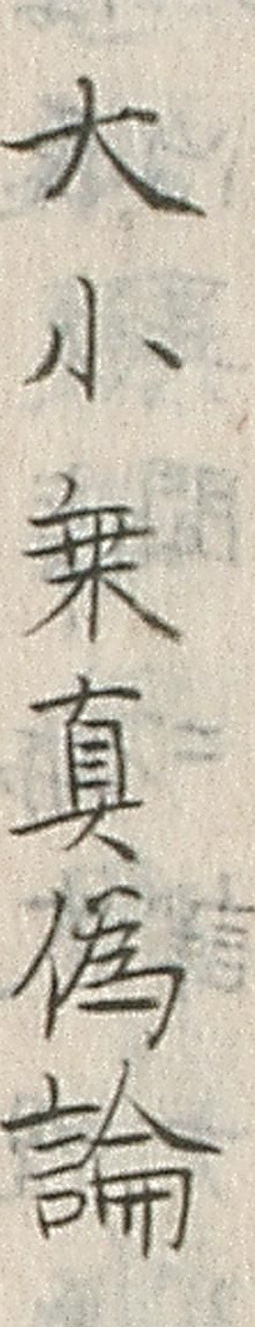大小乗真偽論
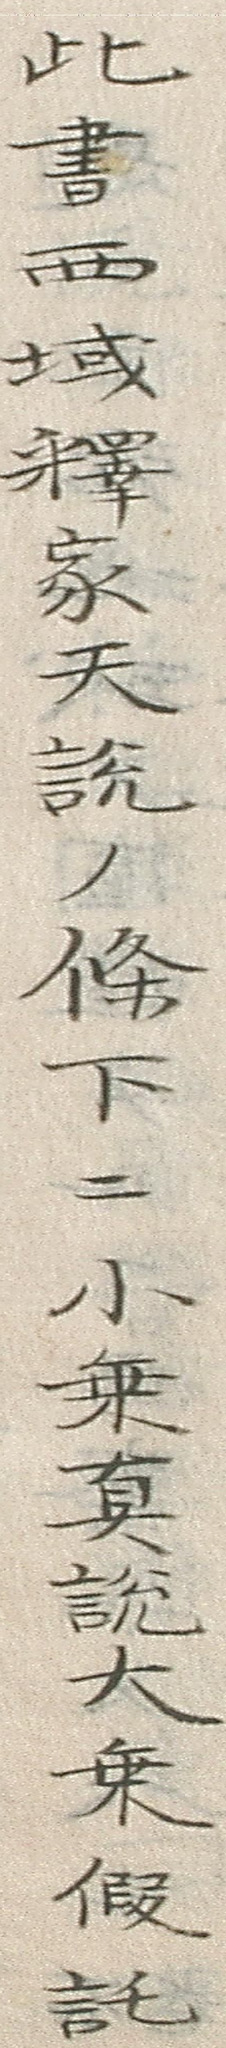此書西域釈家天説ノ条下ニ小乗真説大乗仮託
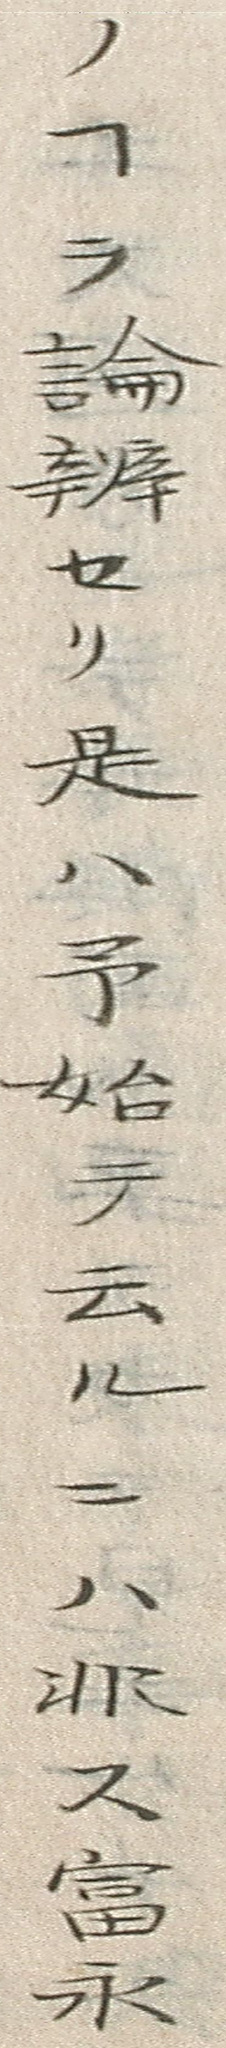ノコトヲ論弁セリ是ハ予始テ云ルニハ非ス富永
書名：天學略名目羽翼　全
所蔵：東京大学地震研究所図書室 Earthquake Research Institute Library, The University of Tokyo, JAPAN
